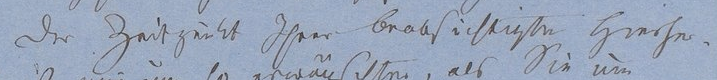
Der Zeitpunkt Ihrer beabsichtigten Hierher-
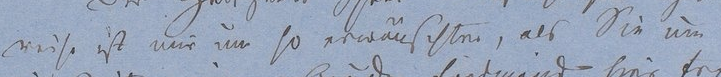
reise ist mir um so erwünschter, als Sie um
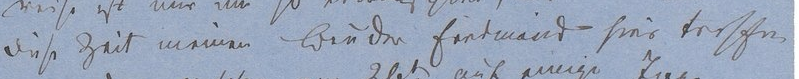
diese Zeit meinen Bruder Ferdinand hier treffen
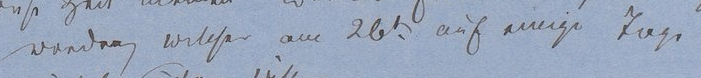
werden, welcher am 26t auf einige Tage
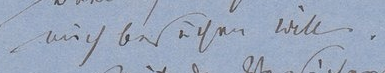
mich besuchen will.
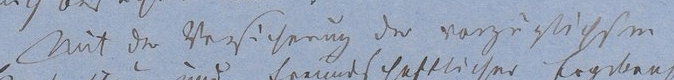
Mit der Versicherung der vorzüglichsten
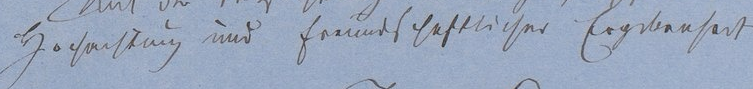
Hochachtung und freundschaftlicher Ergebenheit
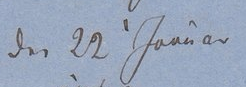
der 22t Januar
